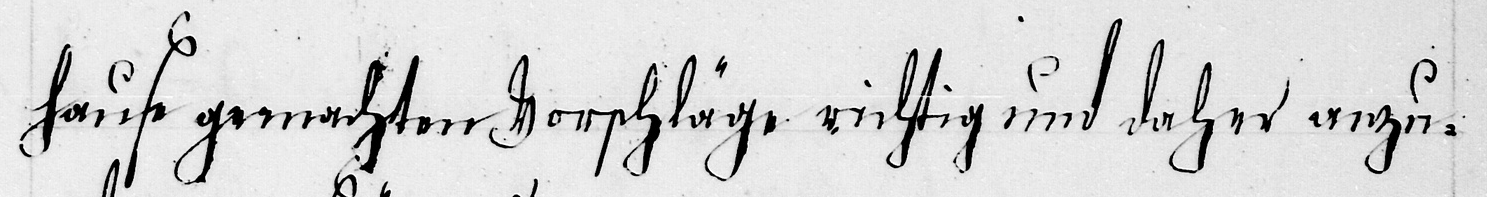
hause gemachten Vorschläge richtig und daher anzu¬
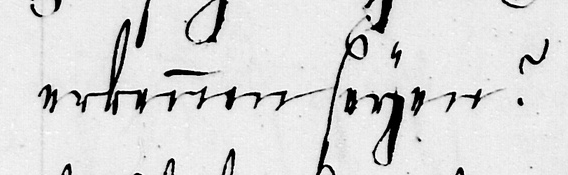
erkennen seyen?
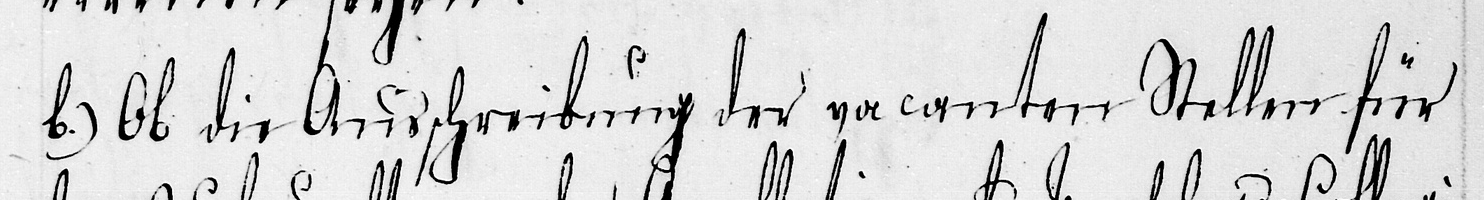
b.) Ob die Ausschreibung der vacanten Stellen für
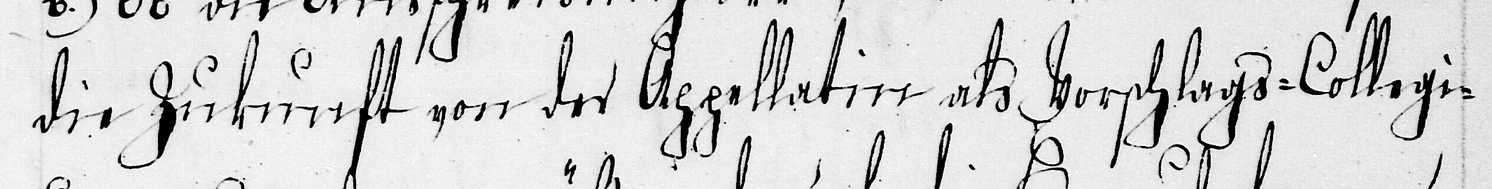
die Zukunft von der Appellatin als Vorschlags-Collegi¬
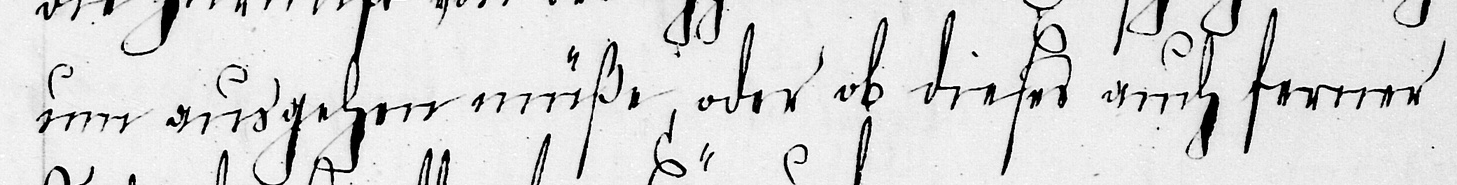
um ausgehen müße, oder ob dieses auch ferner
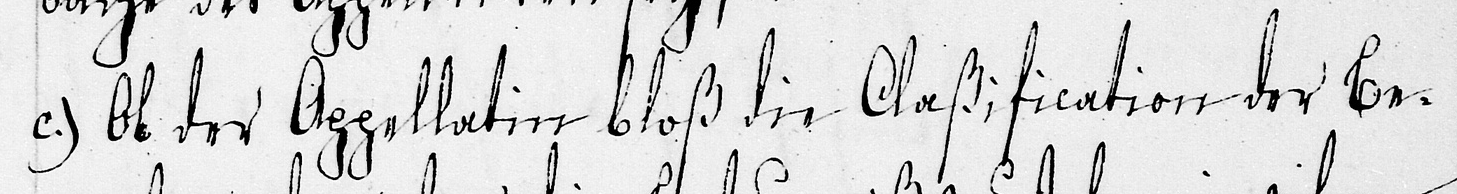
c.) Ob der Appellatin bloß die Claßification der Be¬
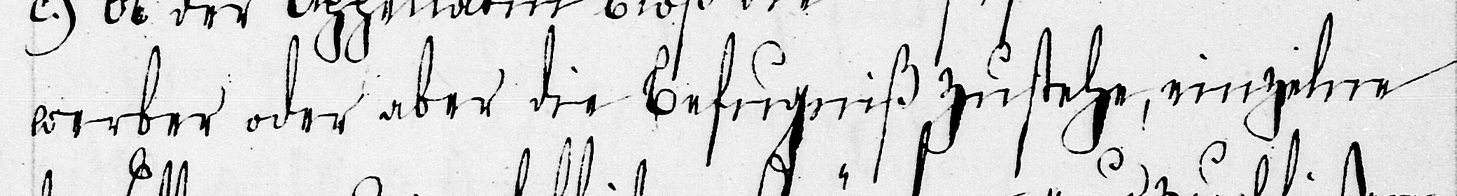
werber oder aber die Befugniß zustehe, einzelne
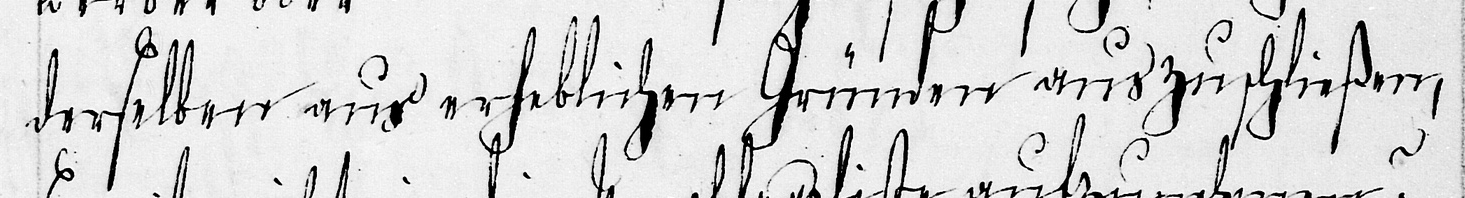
derselben aus erheblichen Gründen auszuschließen,
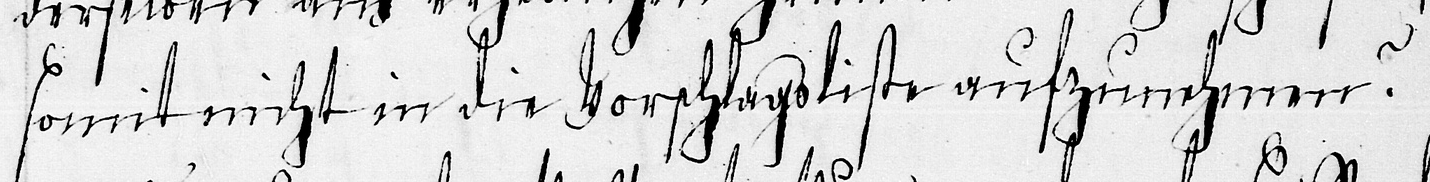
somit nicht in die Vorschlagsliste aufzunehmen?
